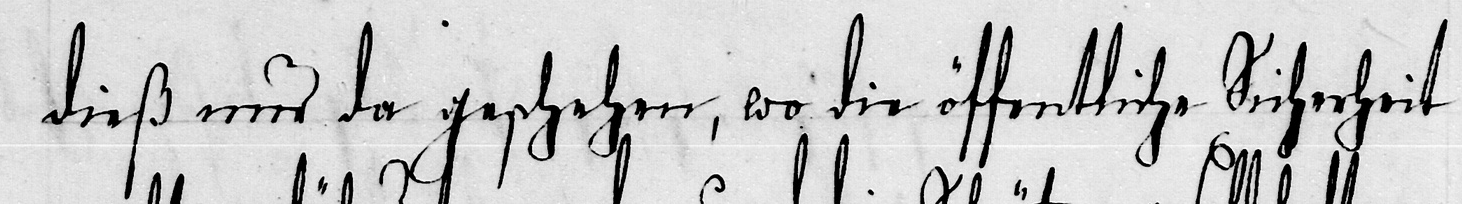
dieß nur da geschehen, wo die öffentliche Sicherheit
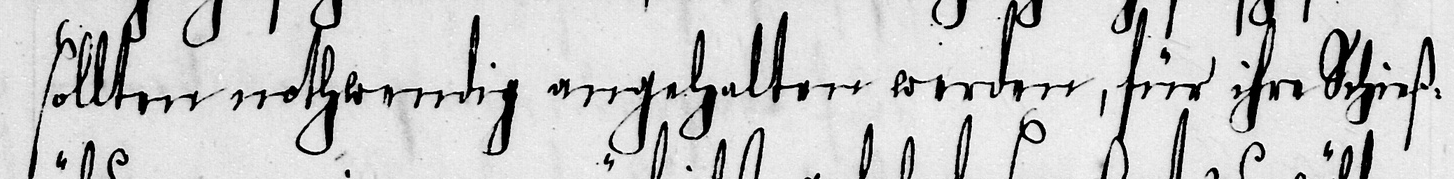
sollten nothwendig angehalten werden, für ihre Schieß¬
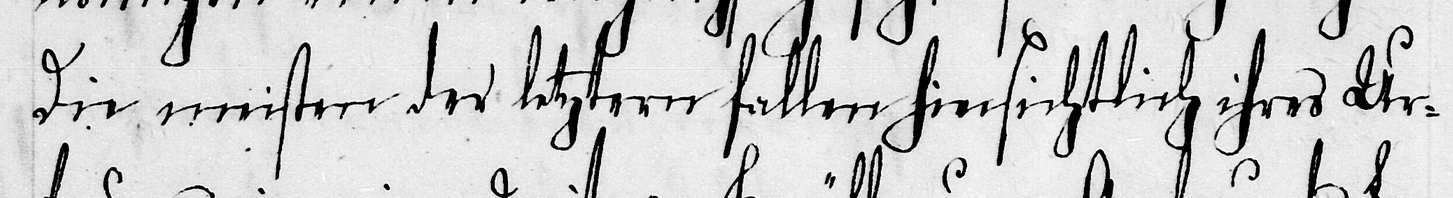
Die meisten der letztern fallen hinsichtlich ihres Ur¬
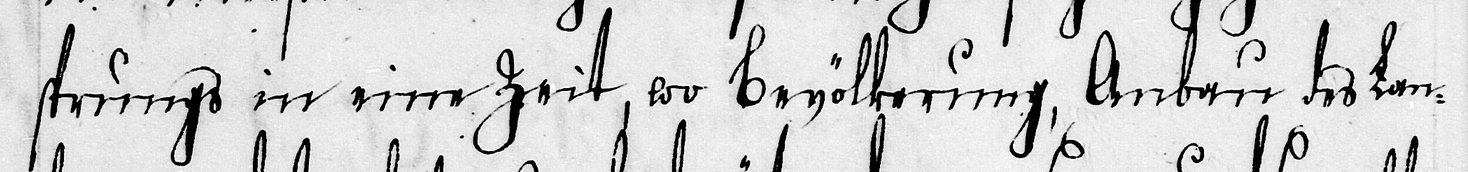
sprungs in eine Zeit, wo Bevölkerung, Anbau des Lan¬
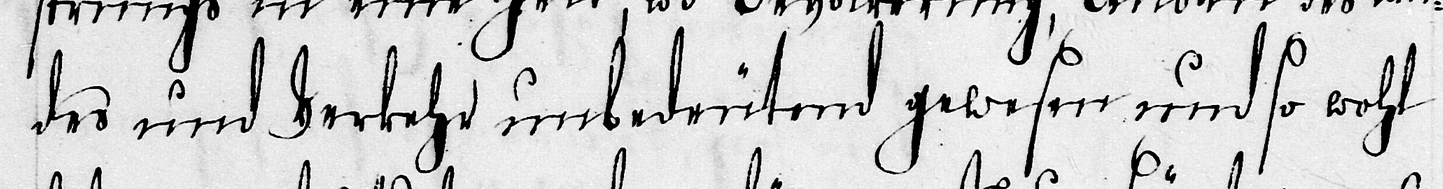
des und Verkehr unbedeutend gewesen und so wohl
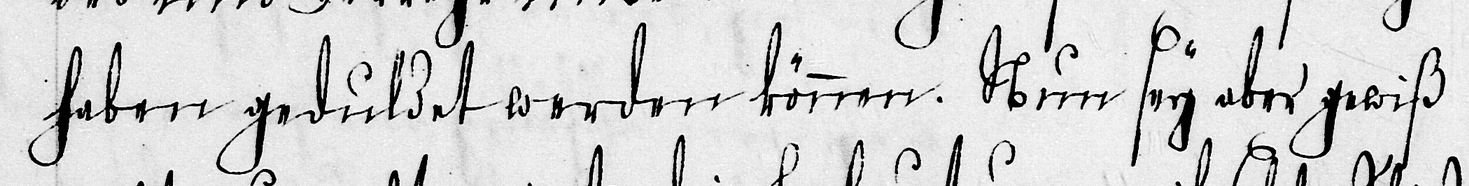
haben geduldet werden können. Nun sey aber gewiß
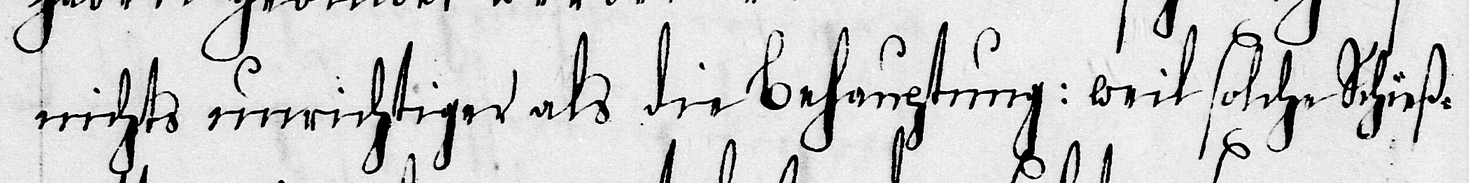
nichts unrichtiger als die Behauptung: weil solche Schie¬
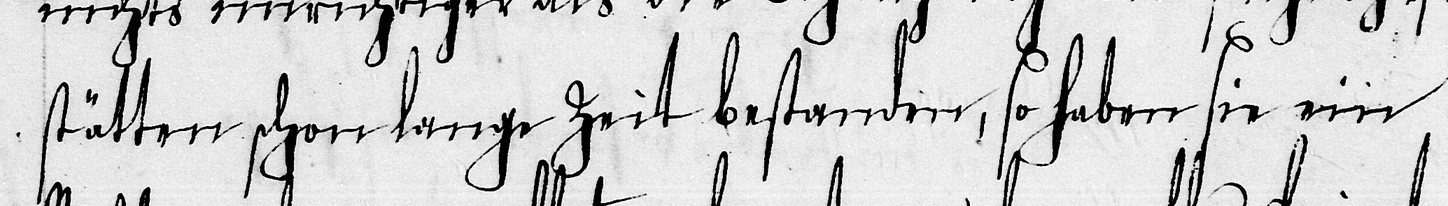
ßstätten schon lange Zeit bestanden, so haben sie ein
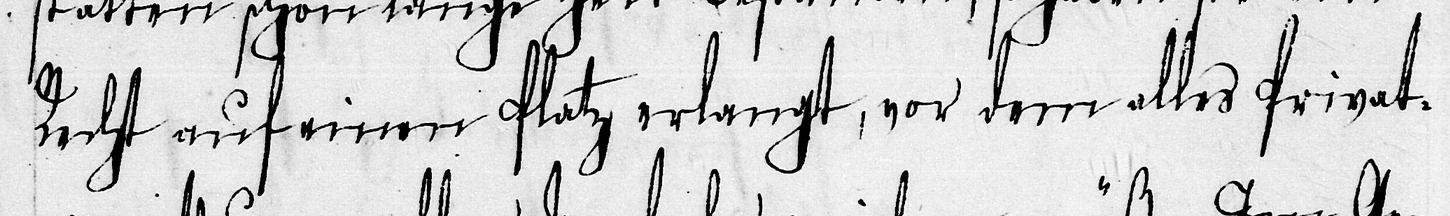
Recht auf einen Platz erlangt, vor dem alles Privat¬
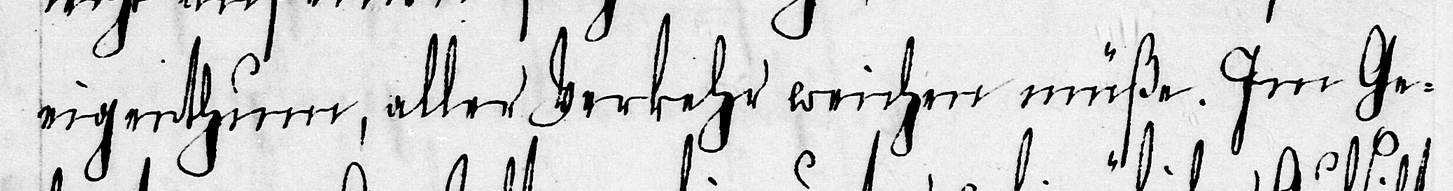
eigenthum, aller Verkehr weichen müße. Im Ge¬
